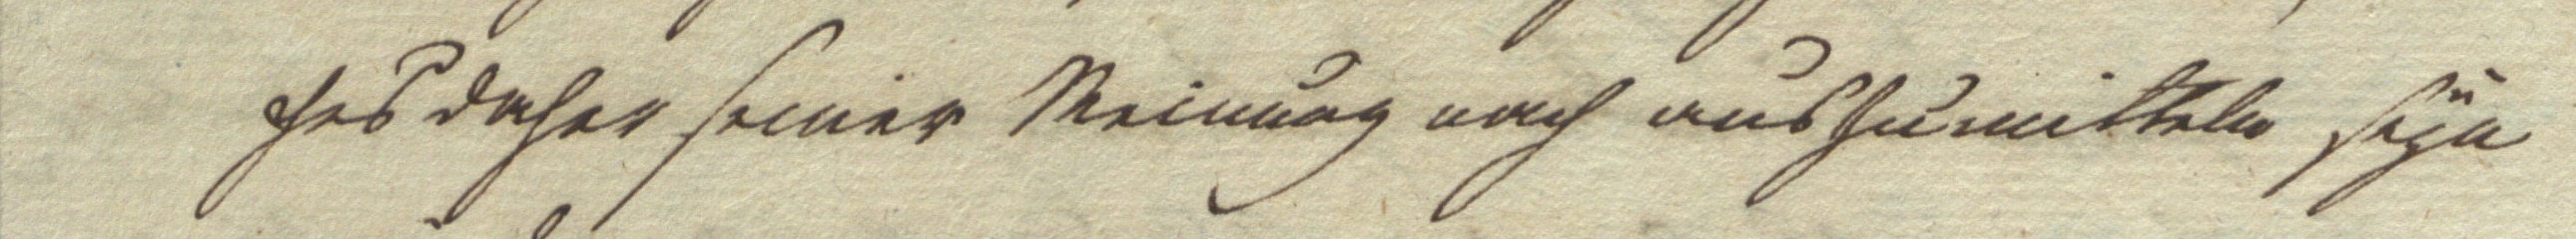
ches daher seiner Meinung nach auszumitteln seyn
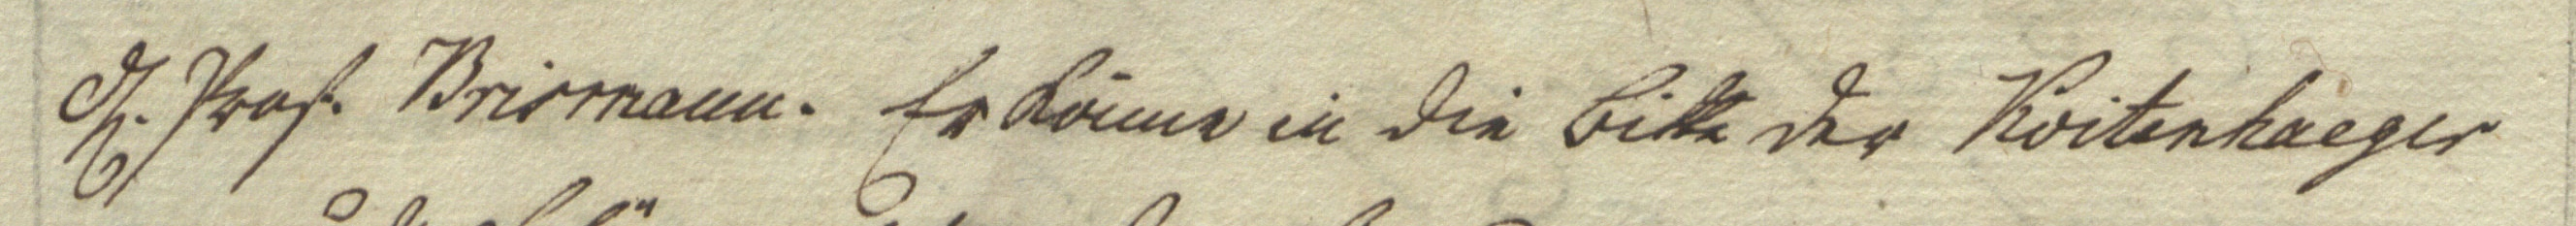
dh. Prof. Brismann. Er könne in die Bitte der Koitenhaeger
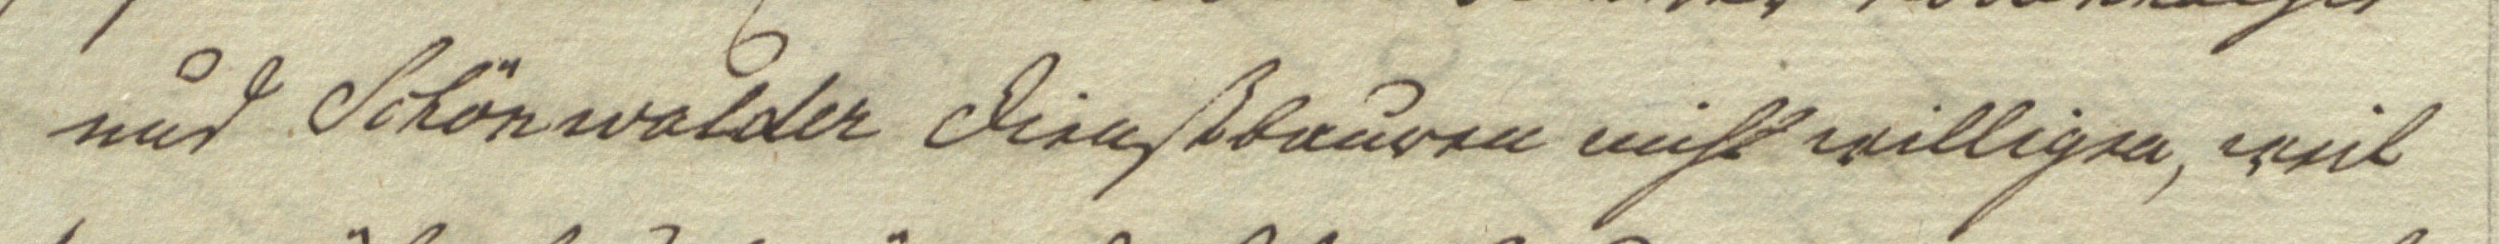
und Schönwalder Dienstbauren nicht willigen, weil
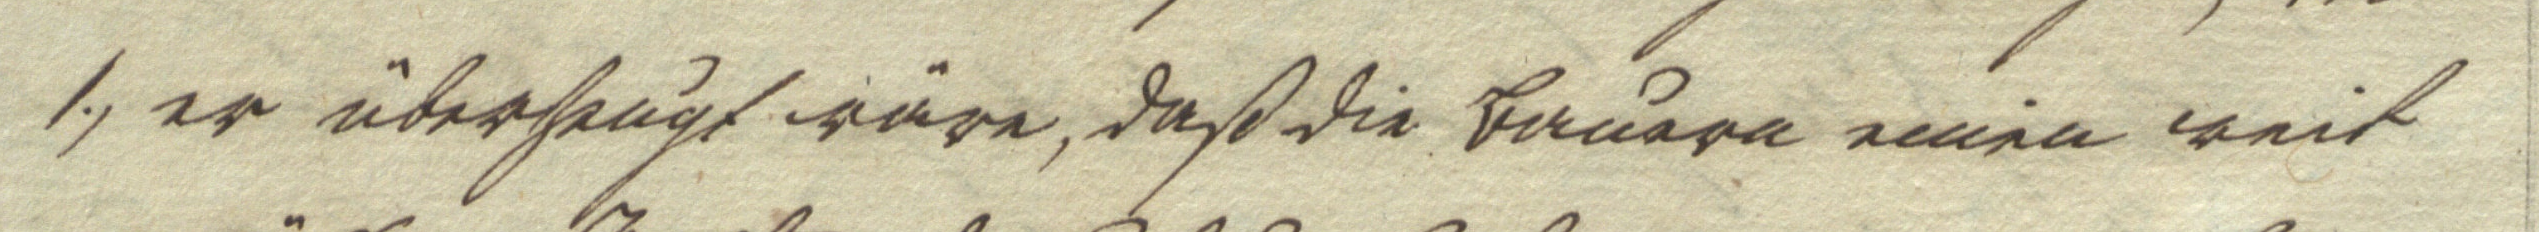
1., er überzeugt wäre, daß die Bauren einen weit
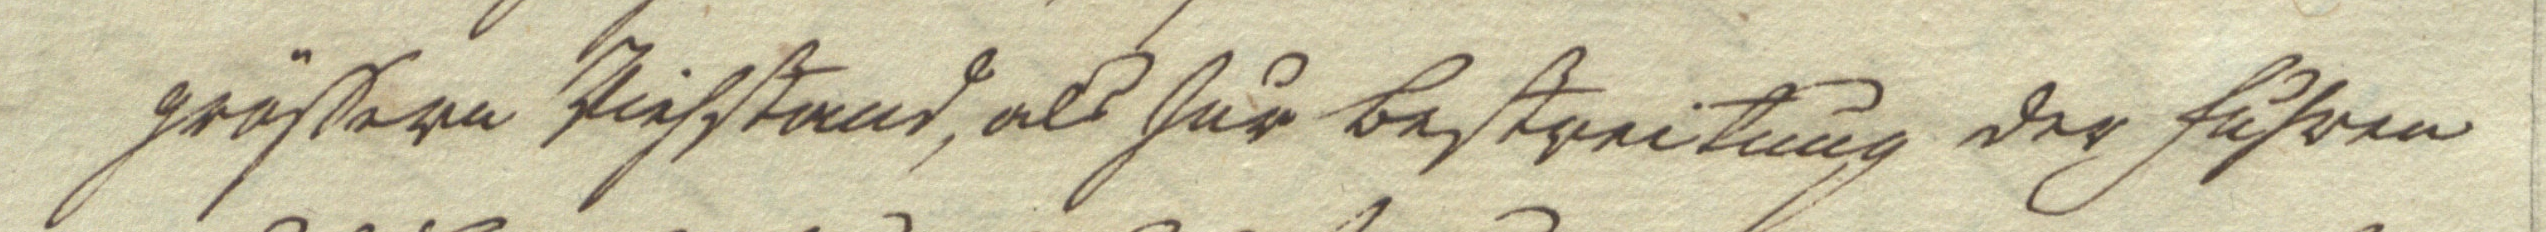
grössern Viehstand, als zur Bestreitung der Fuhren
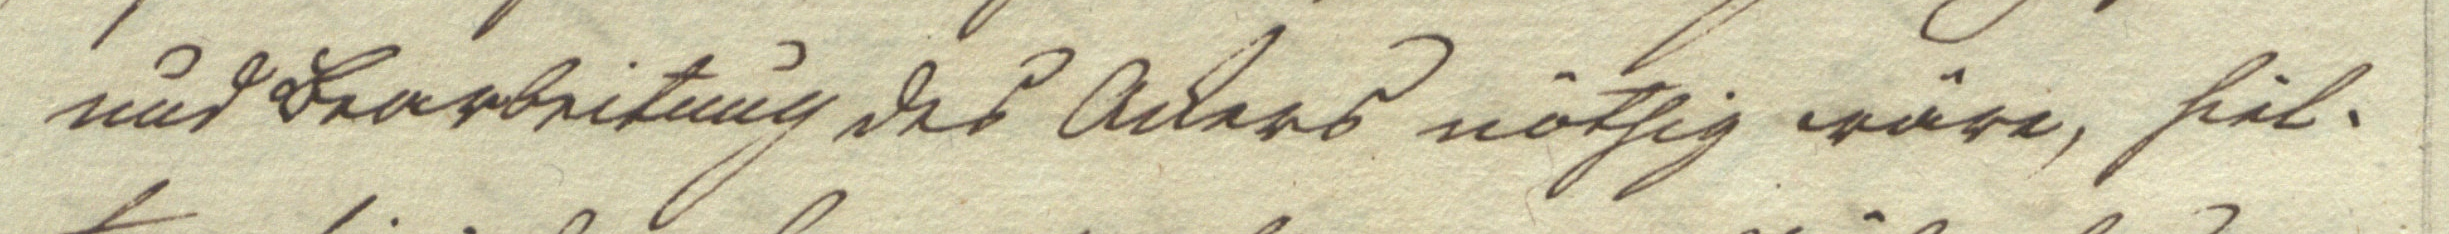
und Bearbeitung des Ackers nötig wäre, hiel¬
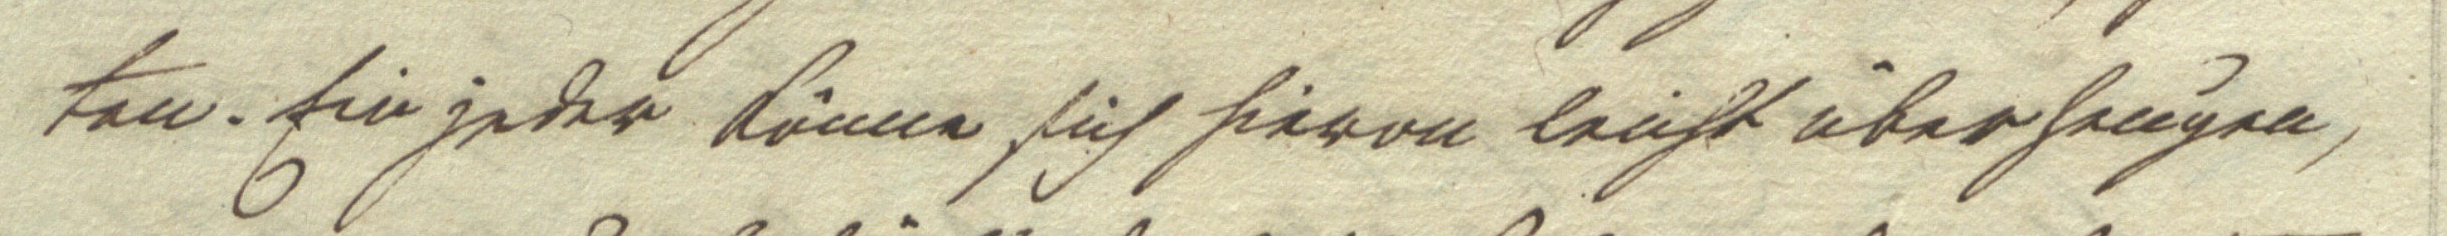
ten. Ein jeder könne sich hievon leicht überzeugen,
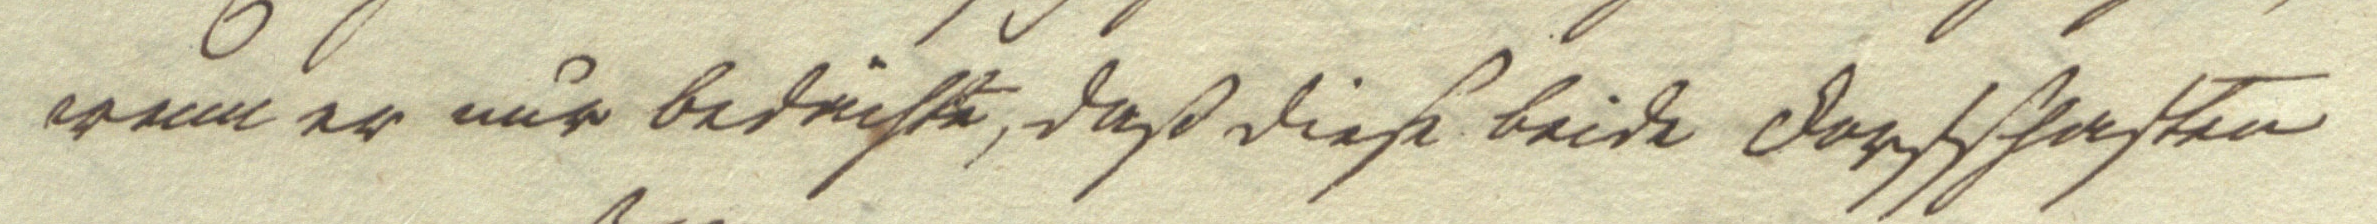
wenn er nur bedächte, daß diese beide Dorfschaften
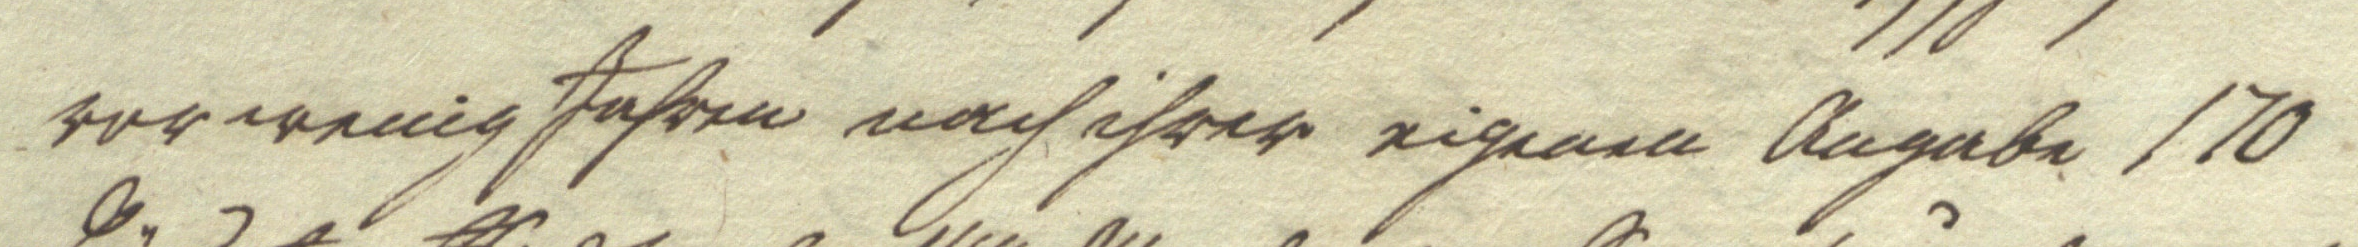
vor wenigen Jahren nach ihrer eigenen Angabe 170
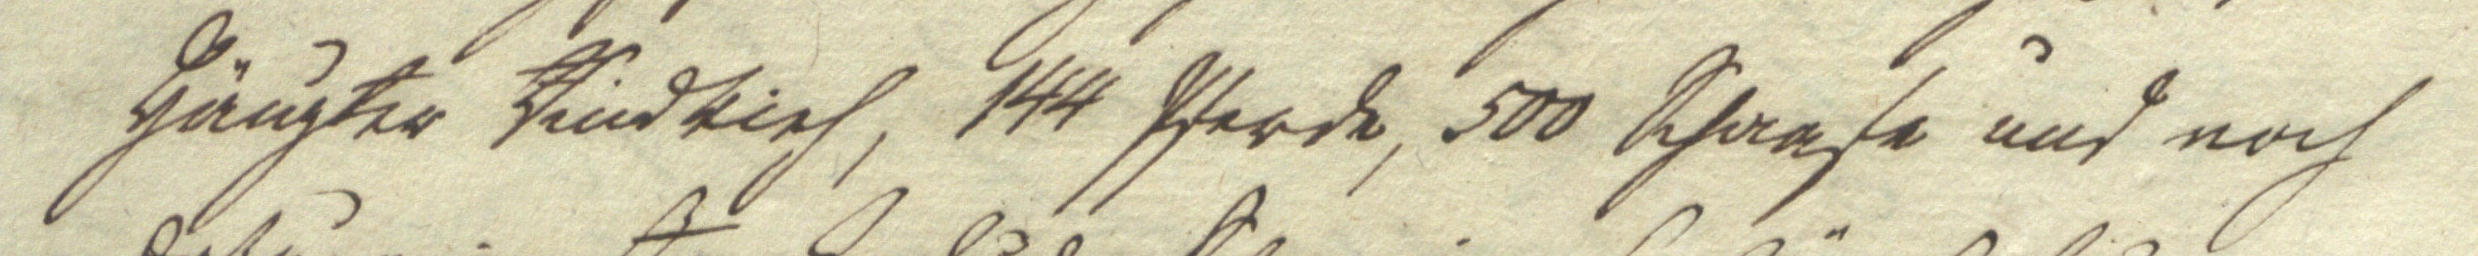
Häupter Rindvieh, 144 Pferde, 500 Schaafe und noch
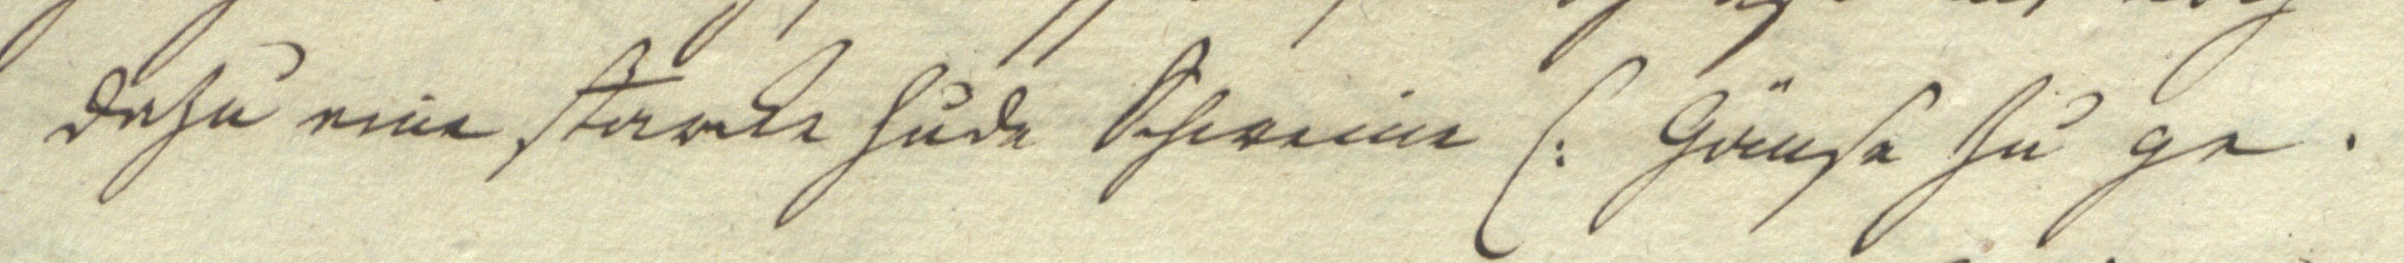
dazu eine starke Hude Schweine (Gänse zu ge-
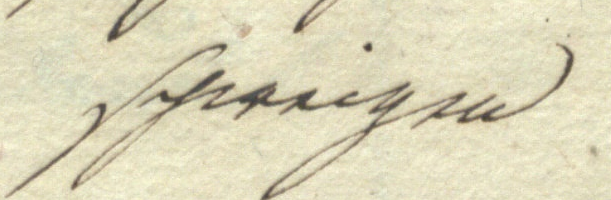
schweigen
